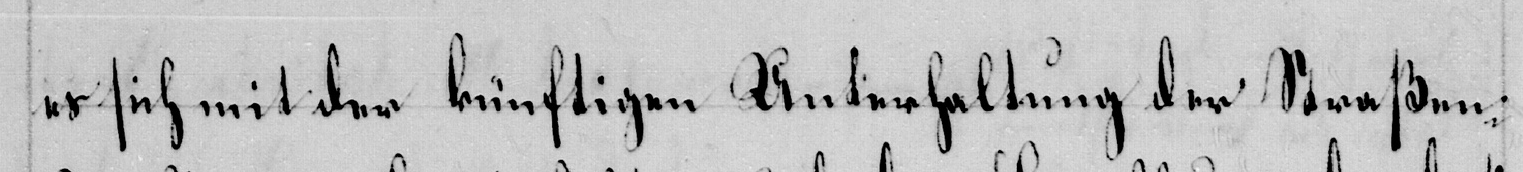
es sich mit der künftigen Unterhaltung der Straßen¬
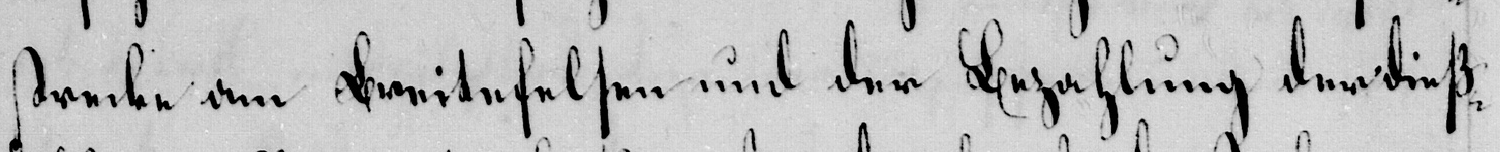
strecke am Breitefelsen und der Bezahlung der dieß¬
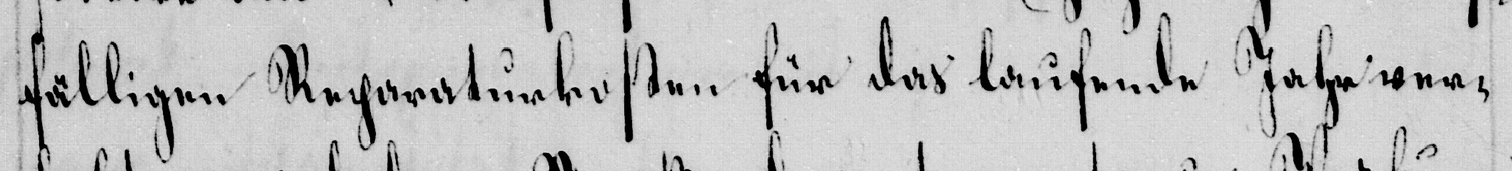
fälligen Reparaturkosten für das laufende Jahr ver¬
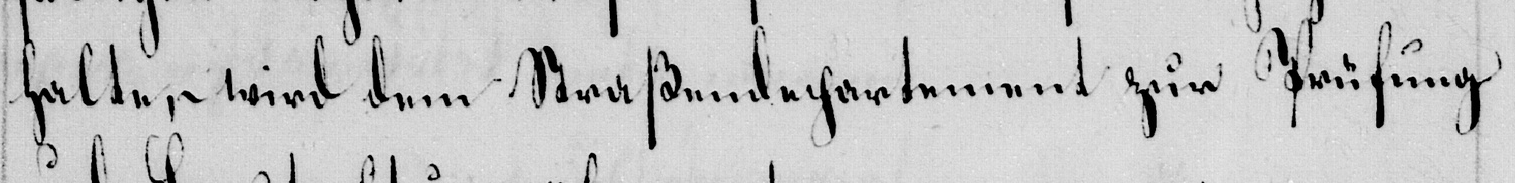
halte, – wird dem Straßendepartement zur Prüfung
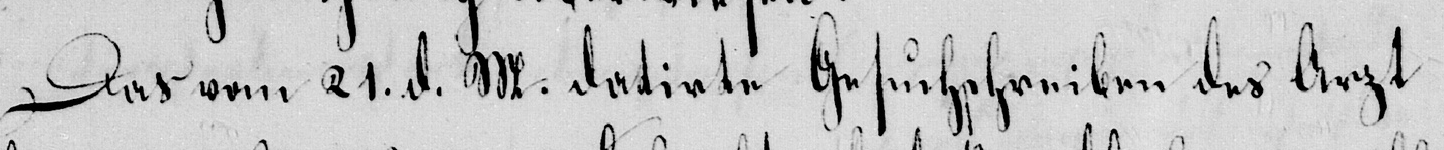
Das vom 21. d. M. datirte Gesuchschreiben des Arzt
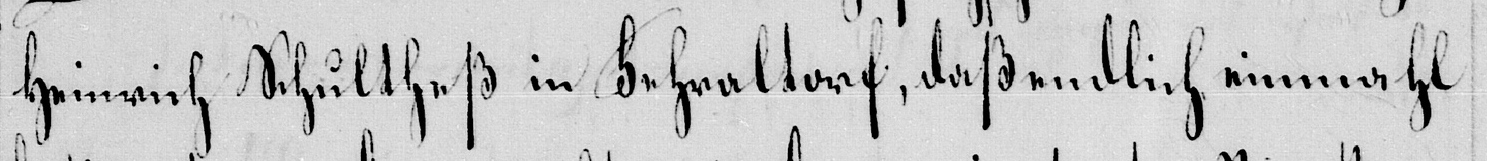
Heinrich Schultheß in Fehaltorf, daß endliche einmahl
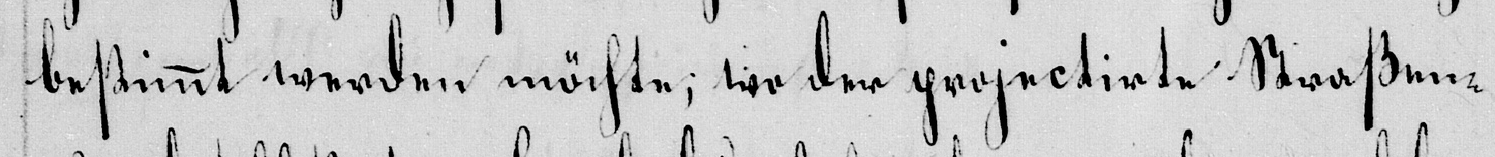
bestimmt werden möchte; wo der projectirte Straßen¬
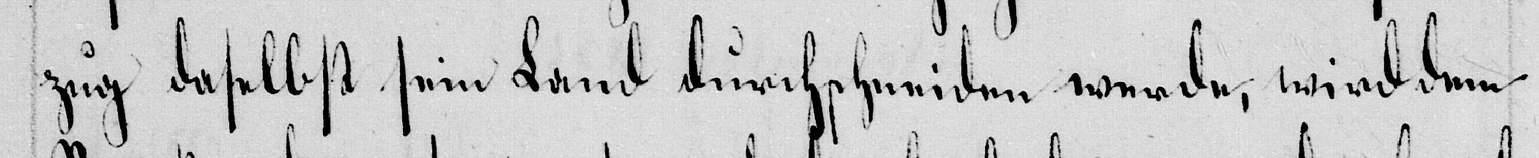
zug daselbst sein Land durchschneiden werde, wird dem
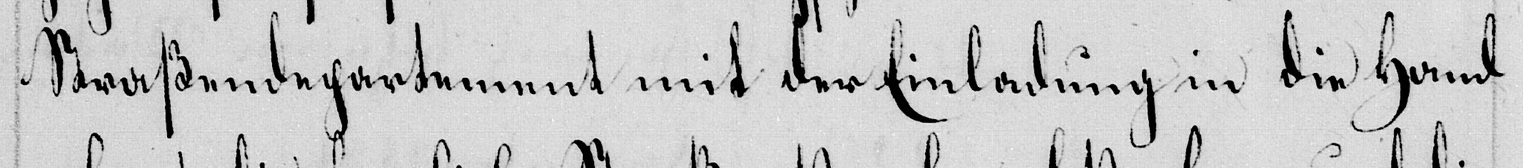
Straßendepartement mit der Einladung in die Hand
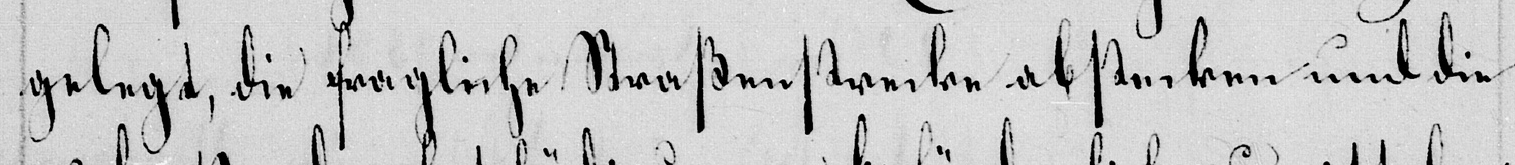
gelegt, die fragliche Straßenstrecke abstecken und die
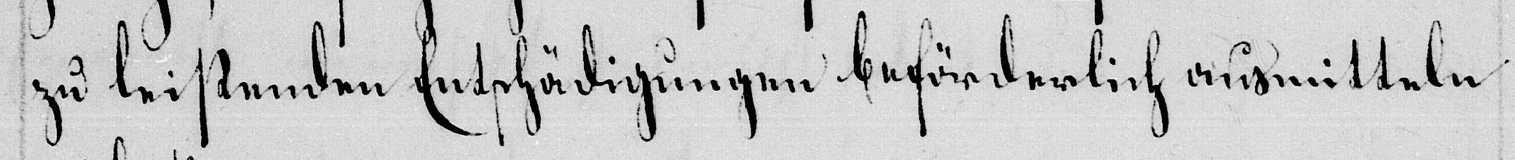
zu leistenden Entschädigungen beförderlich ausmitteln
